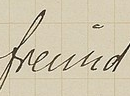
Hochgeehrten
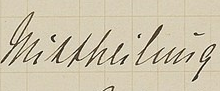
Mittheilung
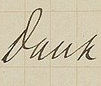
beiden
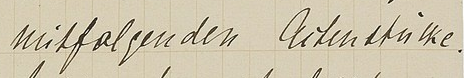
mitfolgenden Actenstücke.
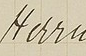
Roth ist
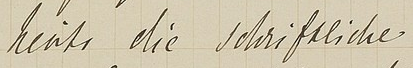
heute die schriftliche
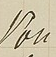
seiner
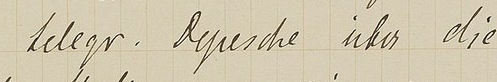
telegr. Depesche über die
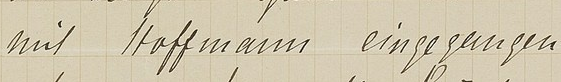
mit Hoffmann eingegangen.
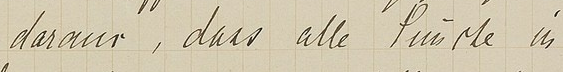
daraus, dass alle Puncte in
